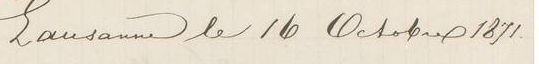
Lausanne le 16 Octobre 1871.
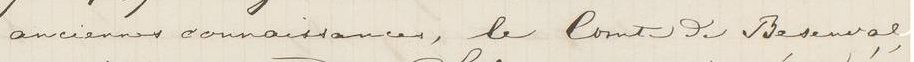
anciennes connaissances, le Comte de Besenval
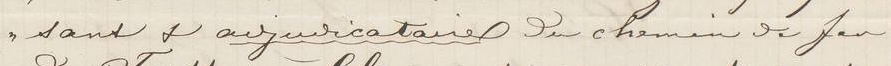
sant & adjudicataire du chemin de fer
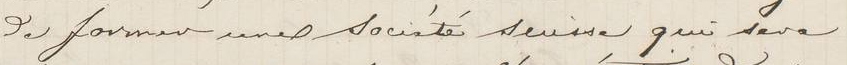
de former une société suisse qui sera
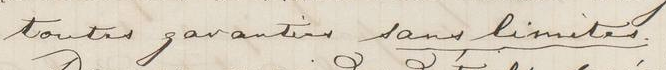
toutes garanties sans limites.
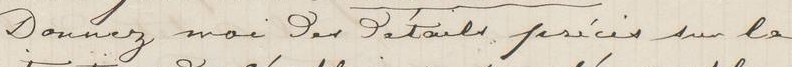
Donnez moi des détails précis sur la
